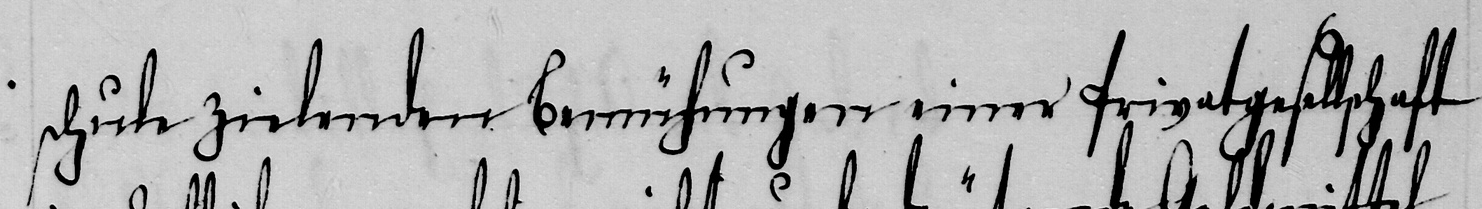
schule zielenden Bemühungen einer Privatgesellschaft
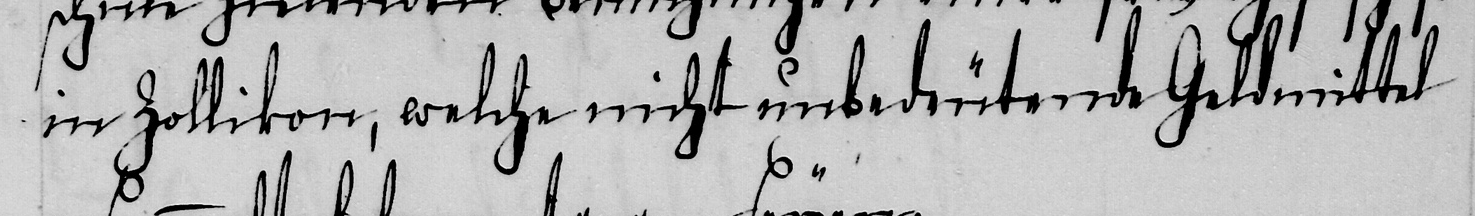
in Zollikon, welche nicht unbedeutende Geldmittel
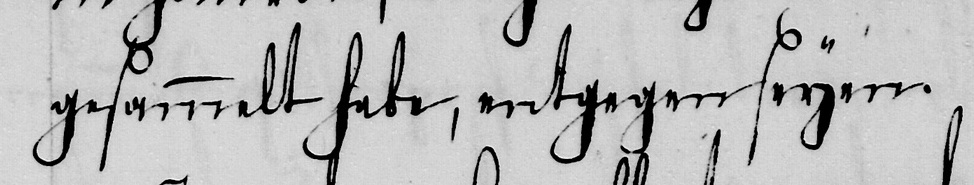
gesammelt habe, entgegen seyen.
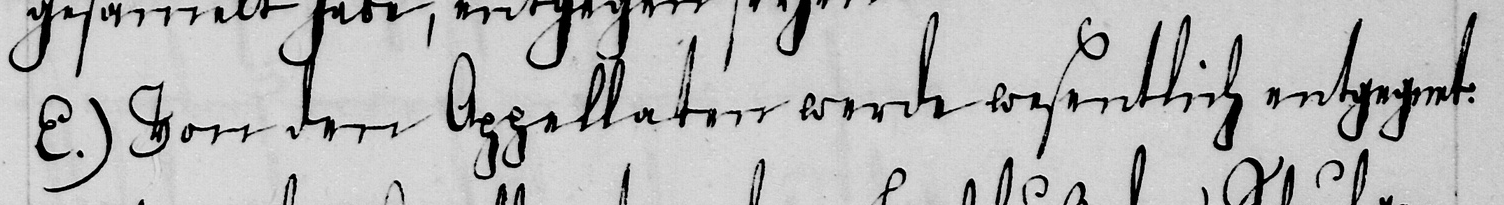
E.) Von den Appellaten werde wesentlich entgegnet:
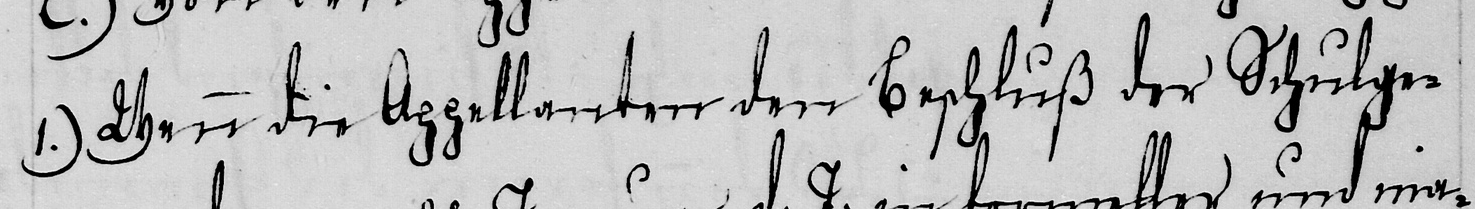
1.) Wenn die Appellanten den Beschluß der Schulge¬
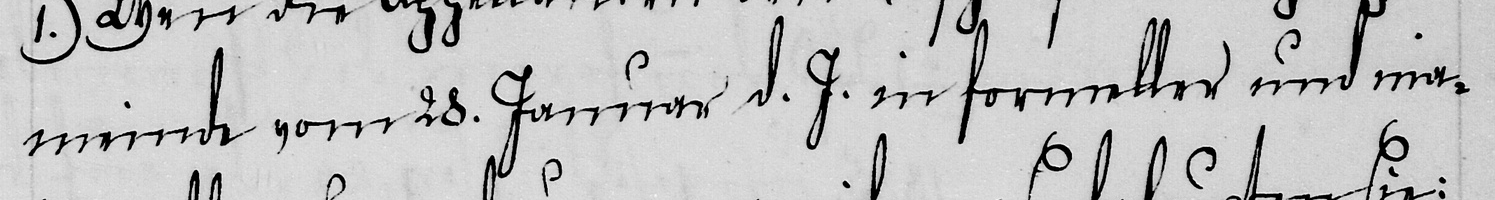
meinde vom 28. Januar d. J. in formeller und ma¬
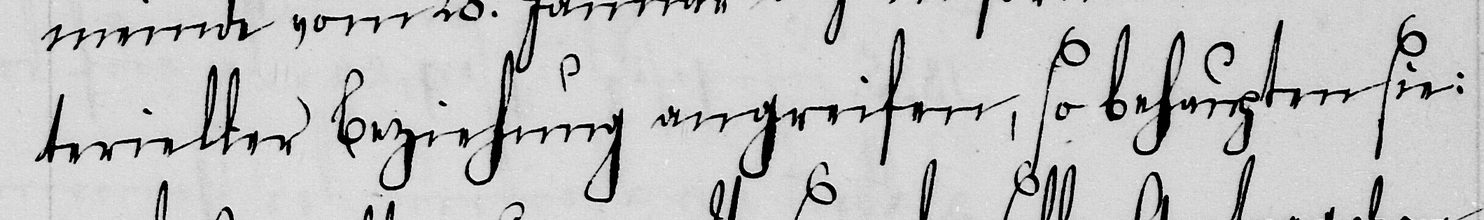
terieller Beziehung angreifen, so behaupten sie:
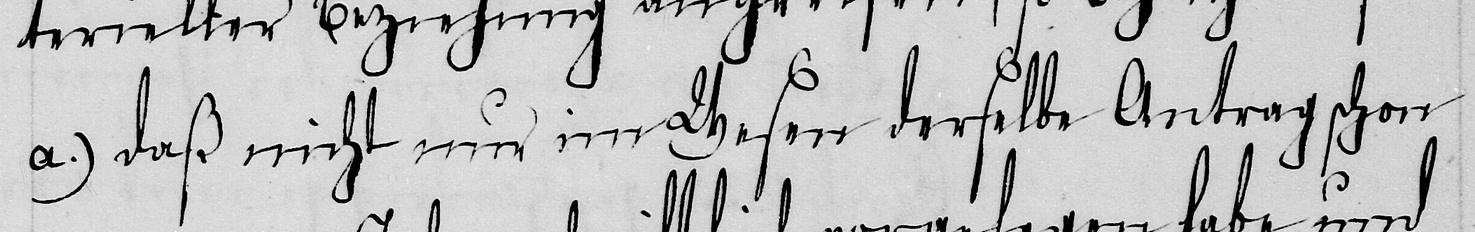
a.) daß nicht nur im Wesen derselbe Antrag schon
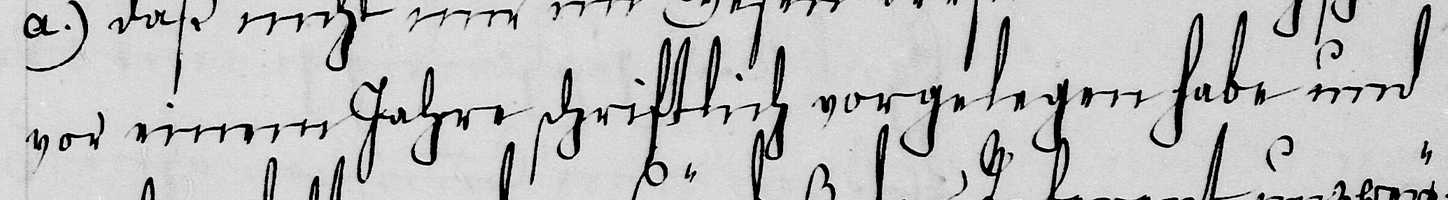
vor einem Jahre schriftlich vorgelegen habe und
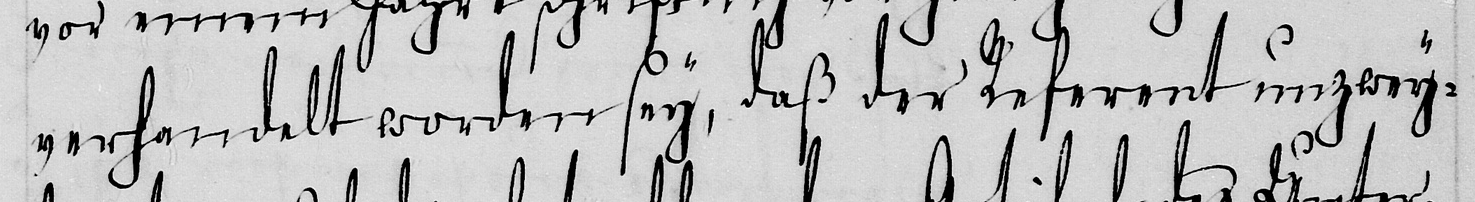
verhandelt worden sey, daß der Referent unzwey¬
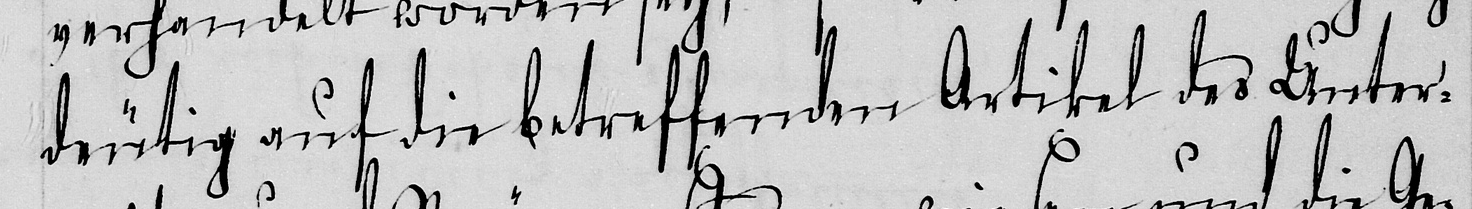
deutig auf die betreffenden Artikel des Unter¬
